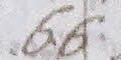66
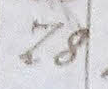28
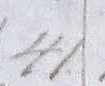41
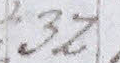32
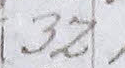32
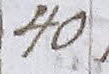40
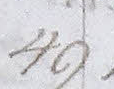49
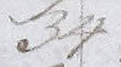34
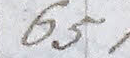65
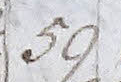59
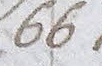66
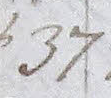37
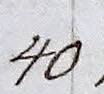40
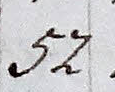52
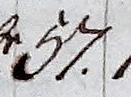52.
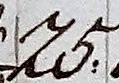25
